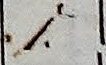1.
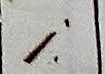1.
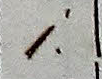1.
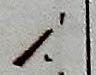1.
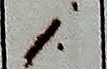1.
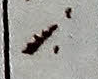1.
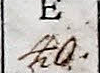40.
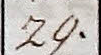29.
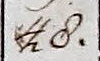48.
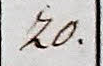20.
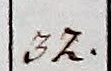32.
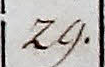29.
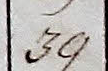39.
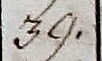39.
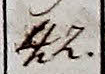42.
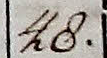48.
